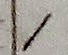1
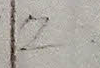2
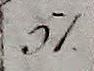57
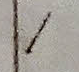1
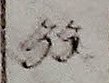33
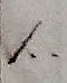1.
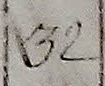32
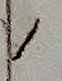1
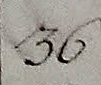36
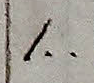1.
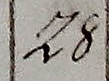28
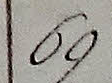69
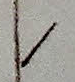1
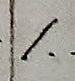1
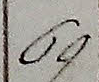69
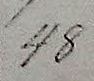48
